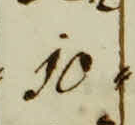10
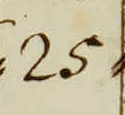25
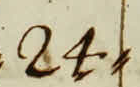24
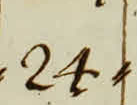24
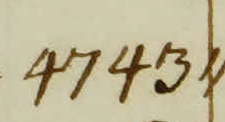4743
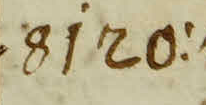8120
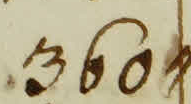360
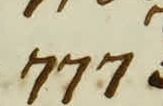777
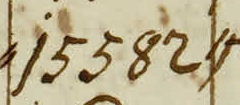15582
